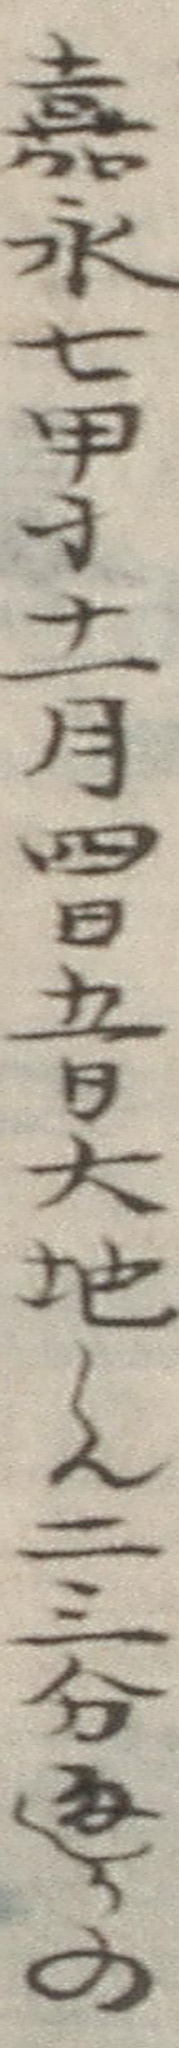嘉永七甲寅十一月四日五日大地しん二三分通りの
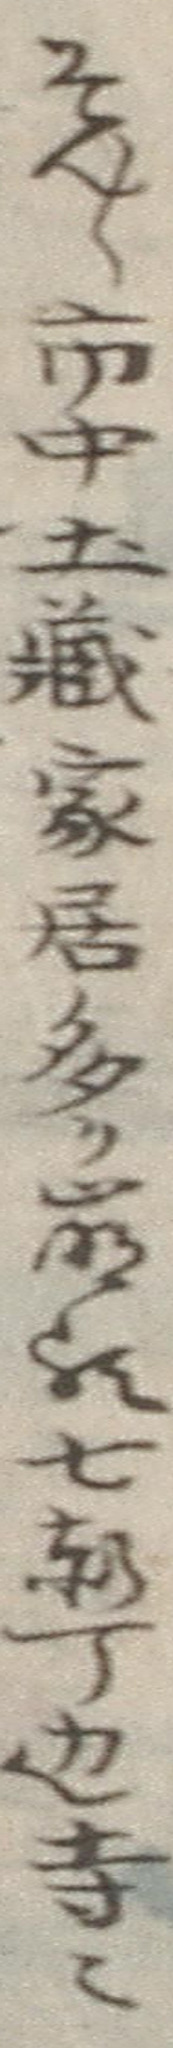そんし市中土蔵家居多ク崩る七軒丁辺寺〻
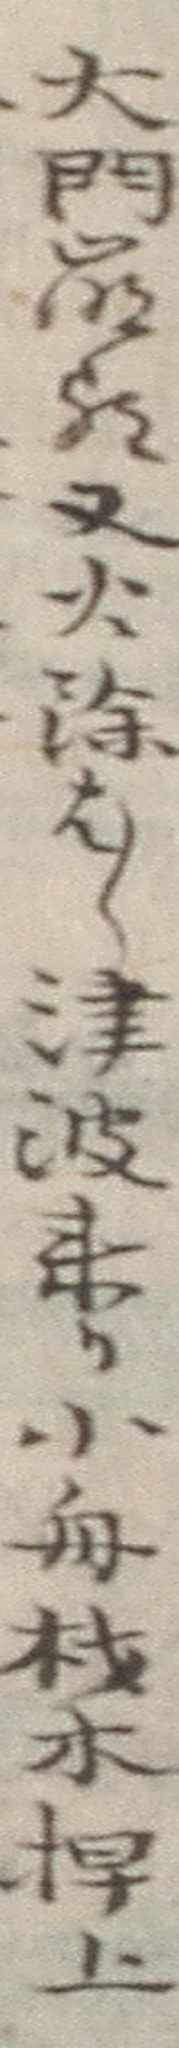大門崩る又火除はし津波来り小舟材木押上
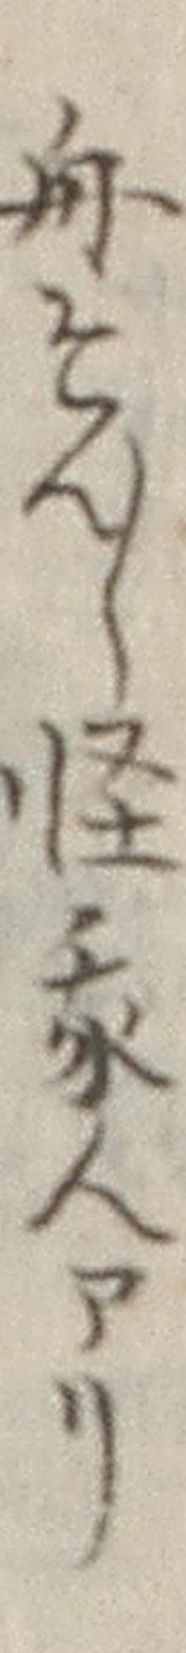舟そんし怪我人あり
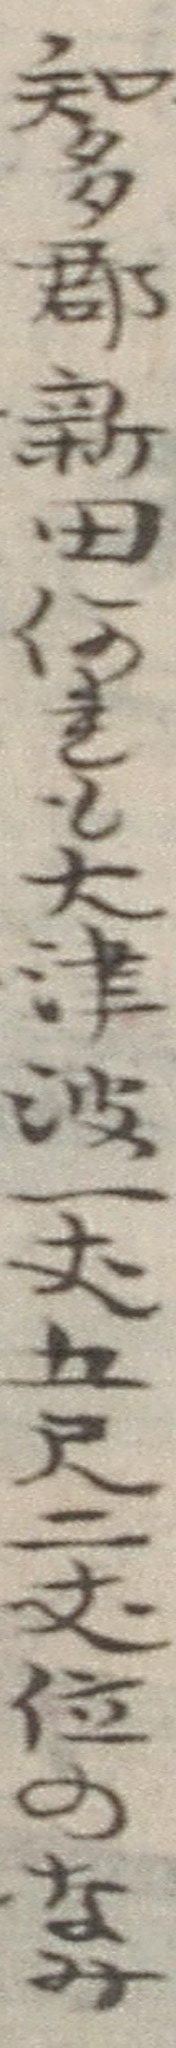知多郡新田何れも大津波一丈五尺二丈位のなみ
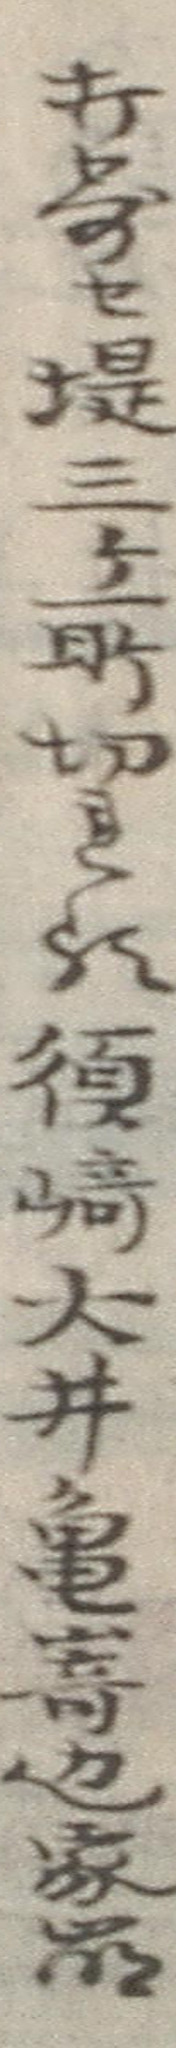打寄せ堤三ケ所切れる須崎大井亀嵜辺家崩
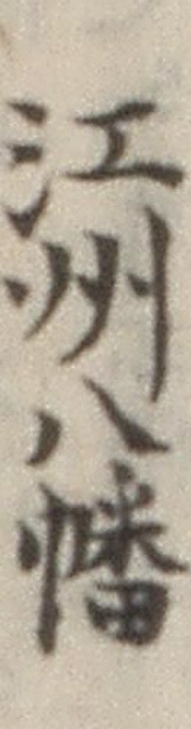江州八幡
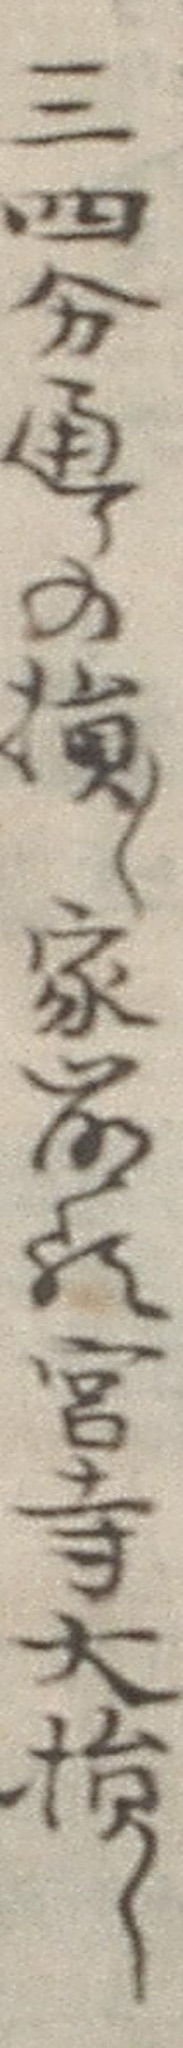三四分通りの損し家崩る宮寺大損し
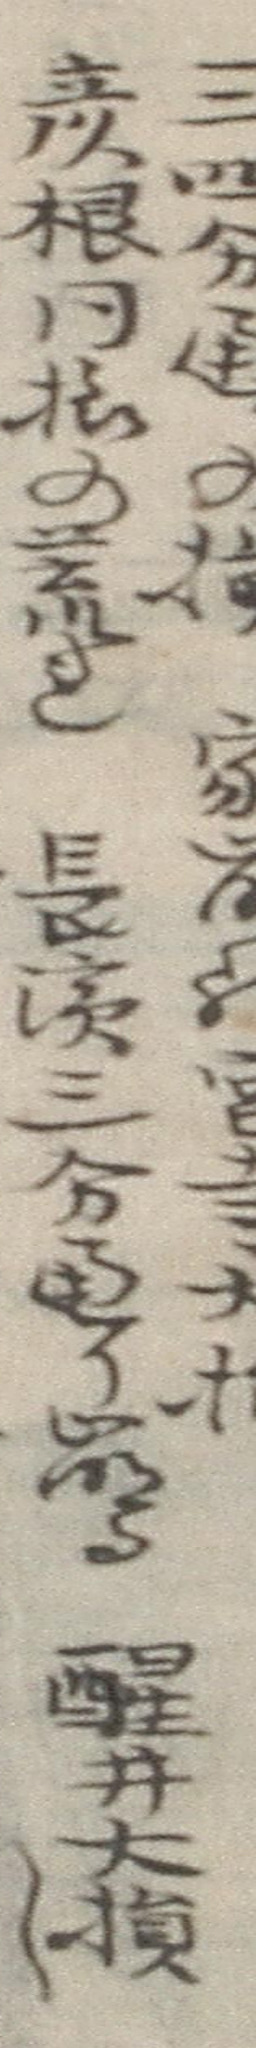彦根同様の荒れ長濱三分通り崩る醒井大損し
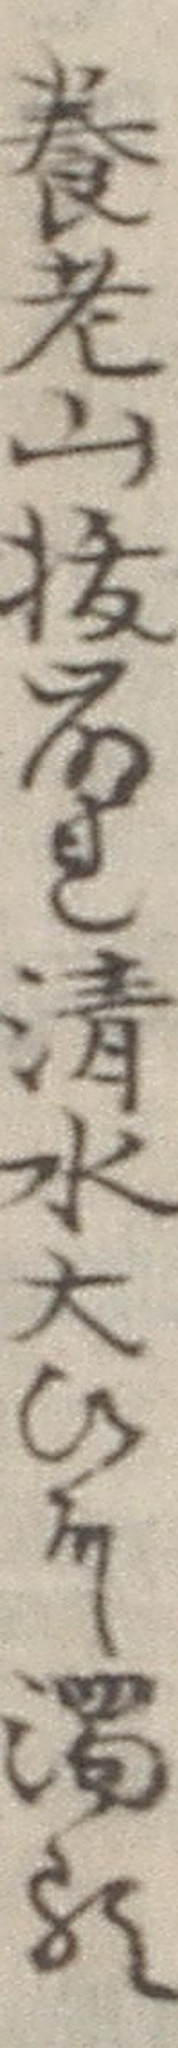養老山抜崩れ清水大ひ川濁る
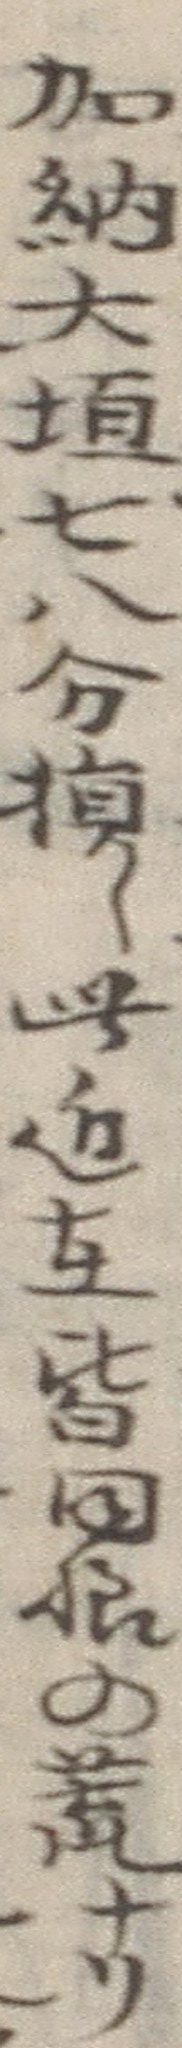加納大垣七八分損し此近在皆同様の荒なり
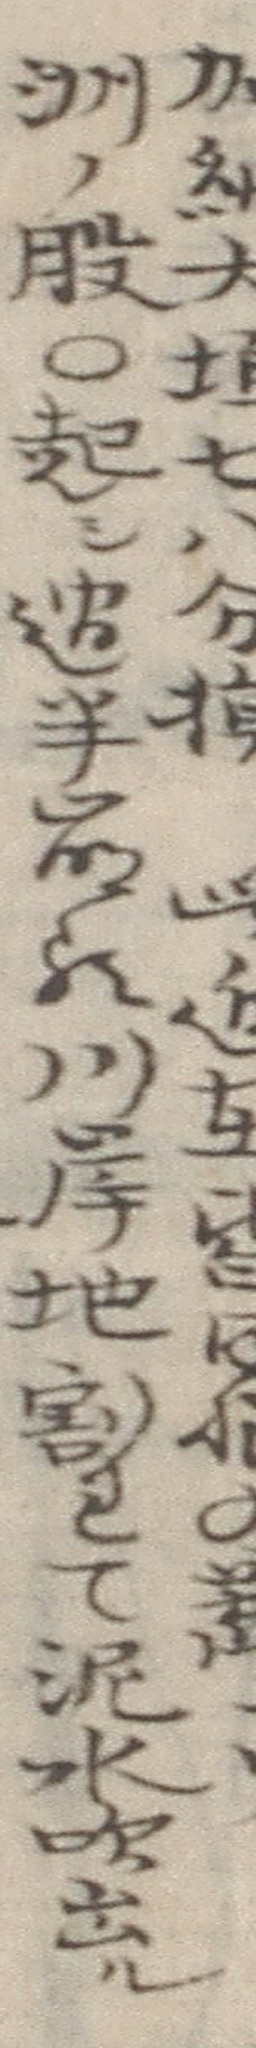洲ノ股○起シ過半崩る川岸地割れて泥水吹出る
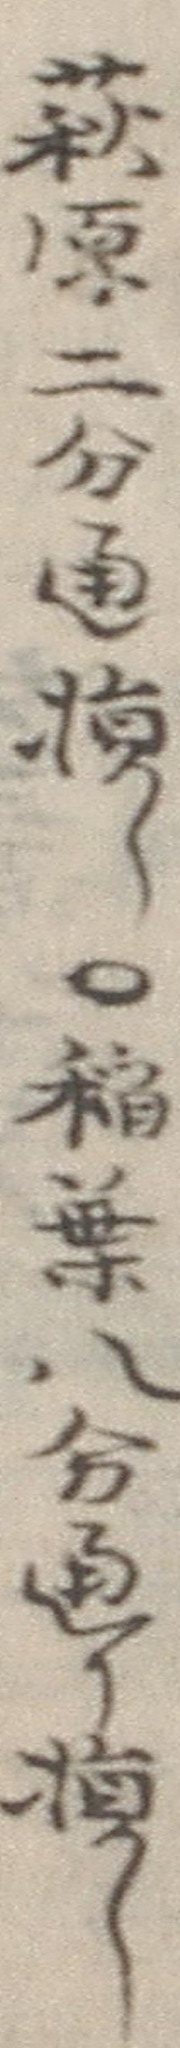萩原二分通損し○稲葉八分通り損し
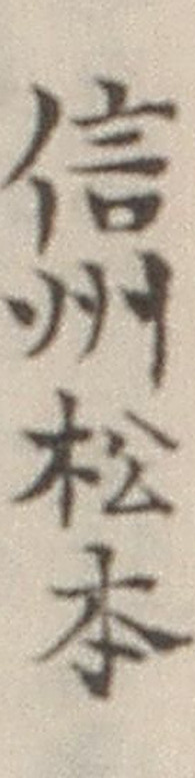信州松本
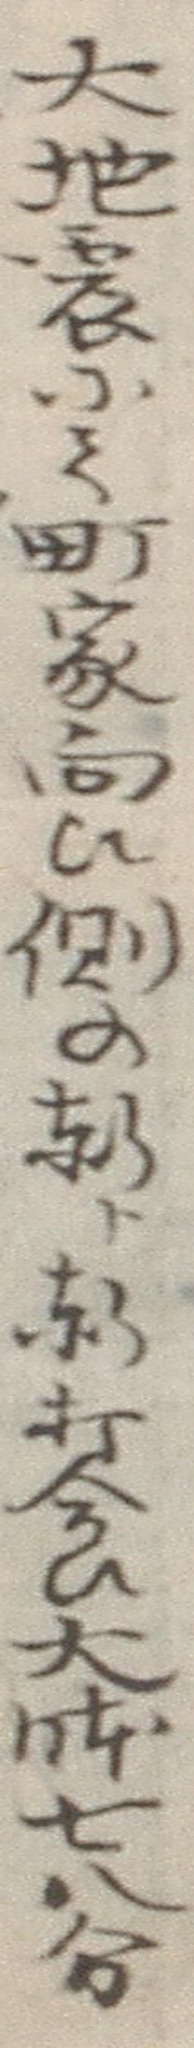大地震にて町家向ひ側の軒と軒打合ひ大体七八分
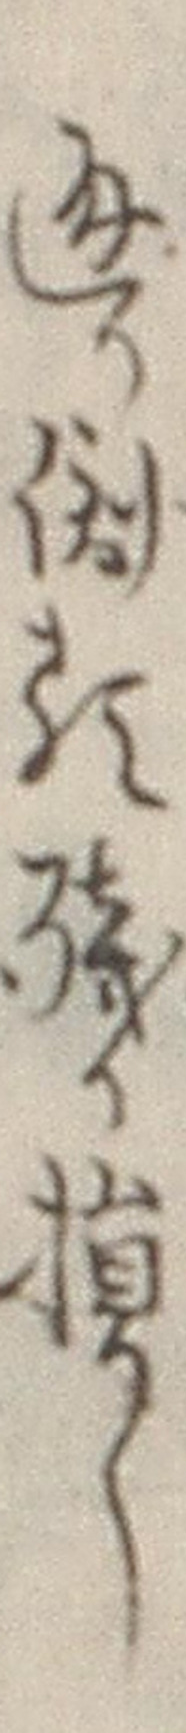通り側る残り損し
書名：諸國大地震年代記末代噺種
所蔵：東京大学地震研究所図書室 Earthquake Research Institute Library, The University of Tokyo, JAPAN
